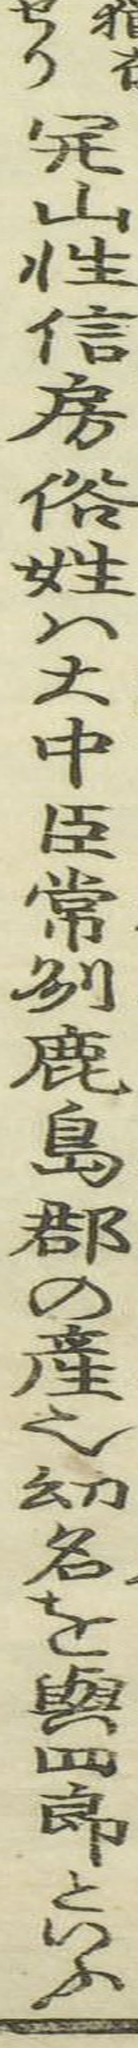猶存せり開山性信房俗姓は大中臣常州鹿島郡の産也幼名を與四郎といふ
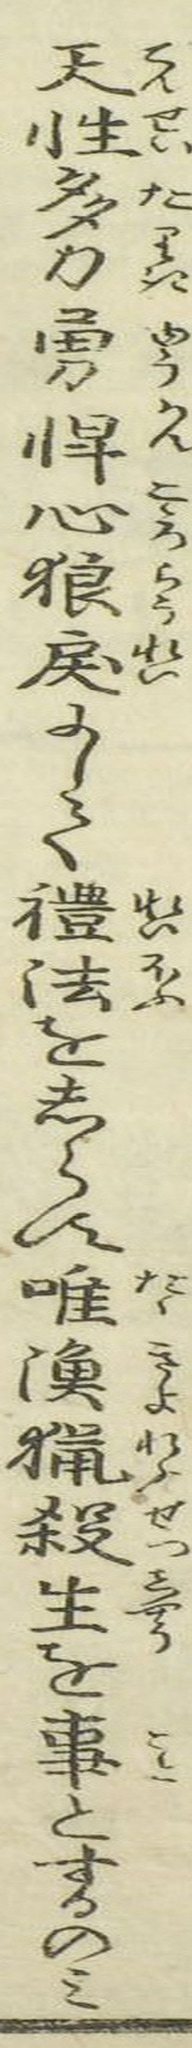天性多力勇悍心狼戻にして礼法をしらす唯漁猟殺生を事とするのみ
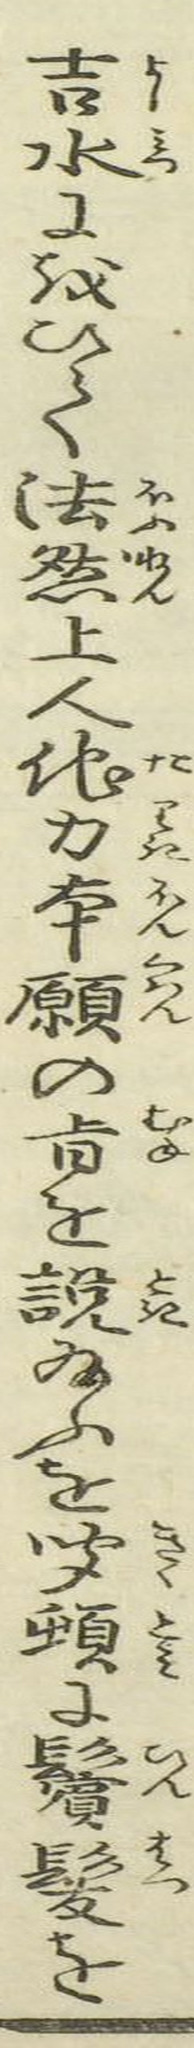吉水にをひて法然上人他力本願の旨を説給ふを聞頓に鬢髪を
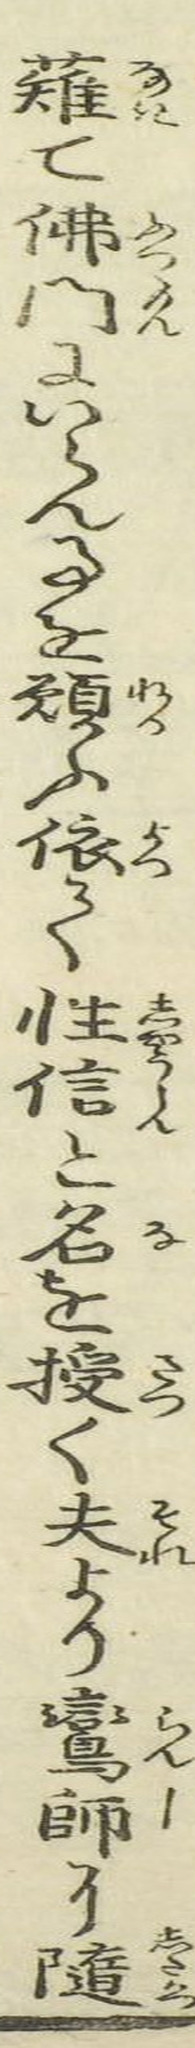薙て仏門にいらん事を願ふ依て性信と名を授く夫より鸞師に随
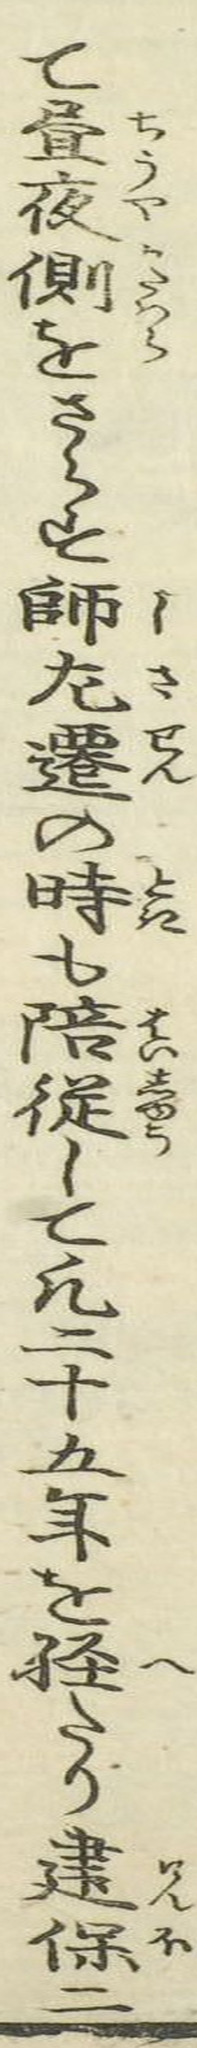て昼夜側をさらす師左遷の時も陪従して凡二十五年を経たり建保二
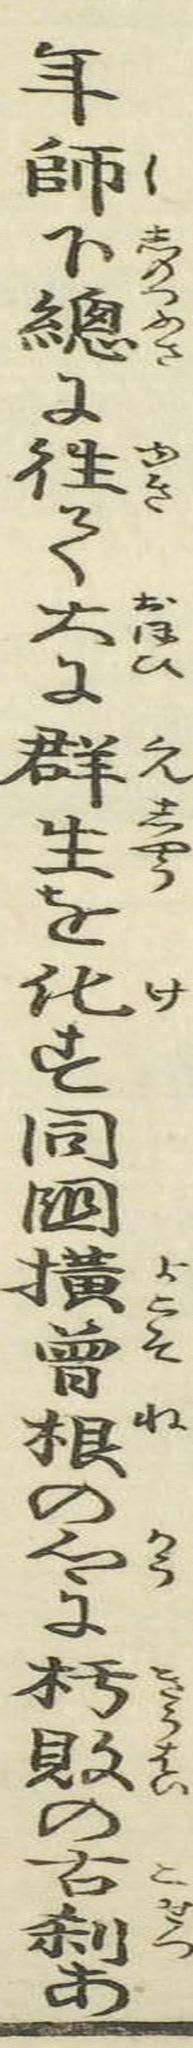年師下総に往て大に群生を化す同国横曽根の郷に朽敗の古刹あ
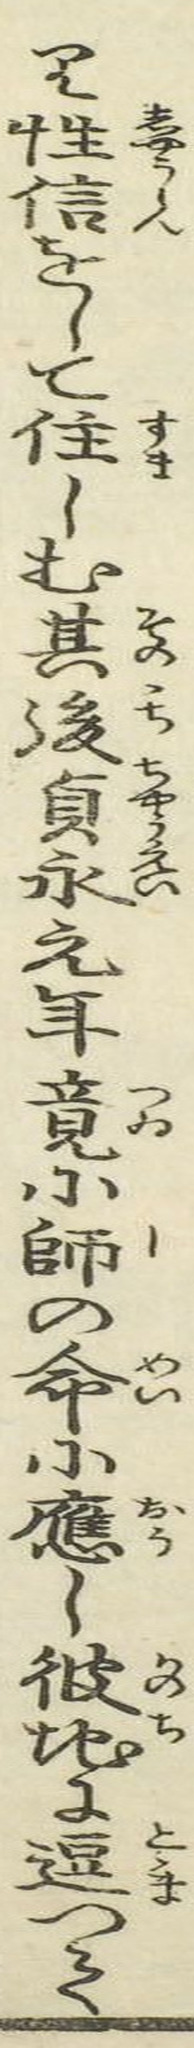り性信をして住しむ其後貞永元年竟に師の命に応し彼地に逗つて
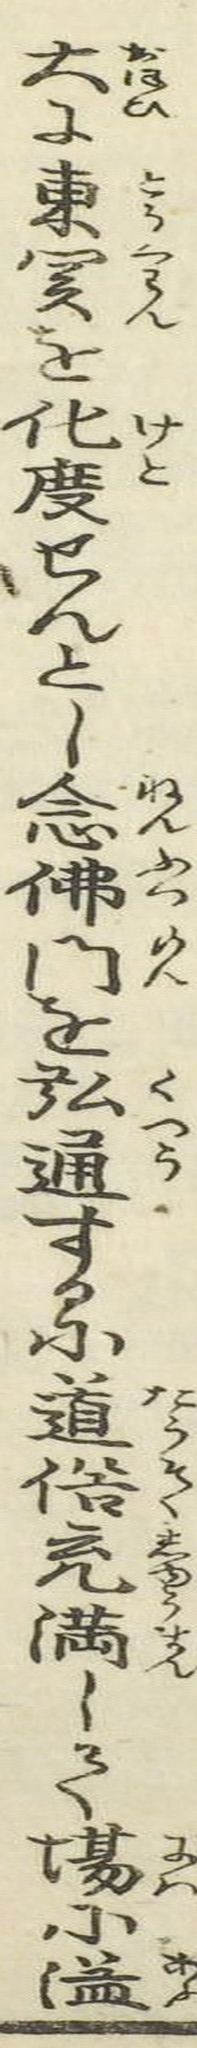大に東関を化度せんとし念仏門を弘通するに道俗充満して場に溢
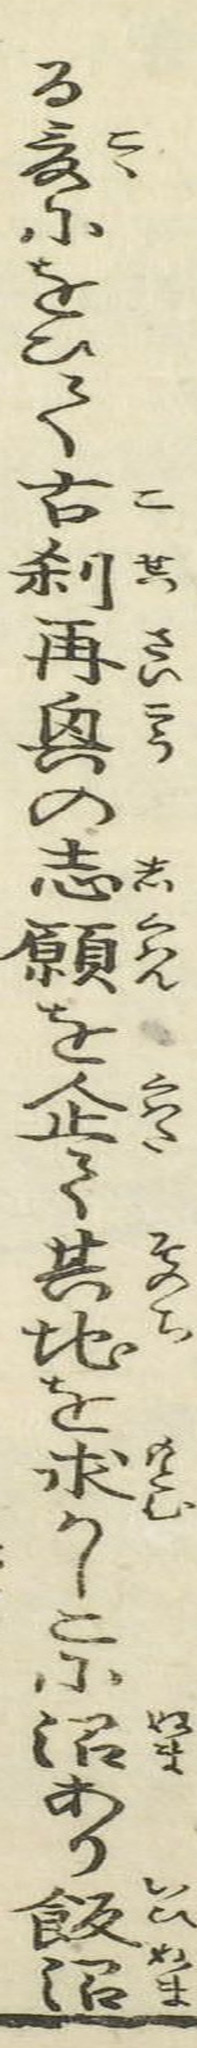る爰にをひて古刹再興の志願を企て其地を求かしこに沼あり飯沼
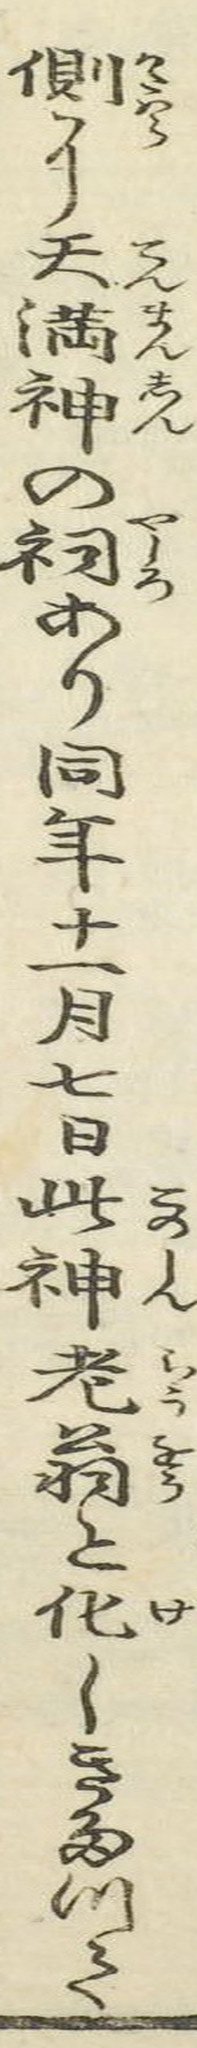側に天満神の祠あり同年十一月七日此神老翁と化しきたつて
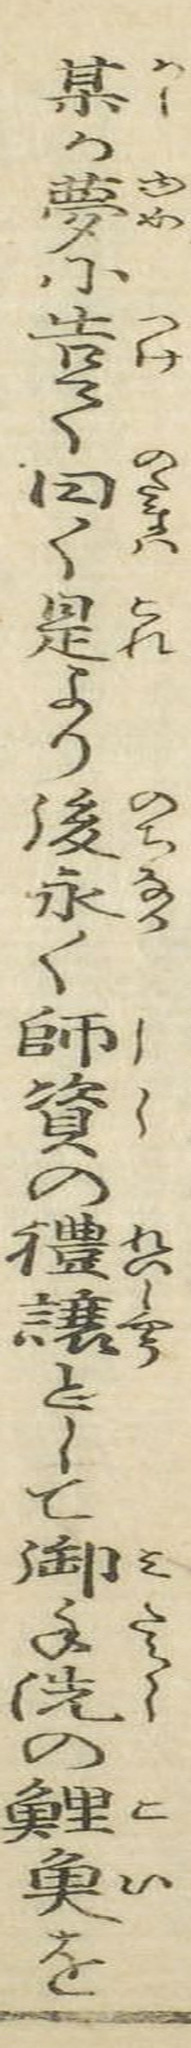某か夢に告て曰く是より後永く師資の礼譲として御手洗の鯉魚を
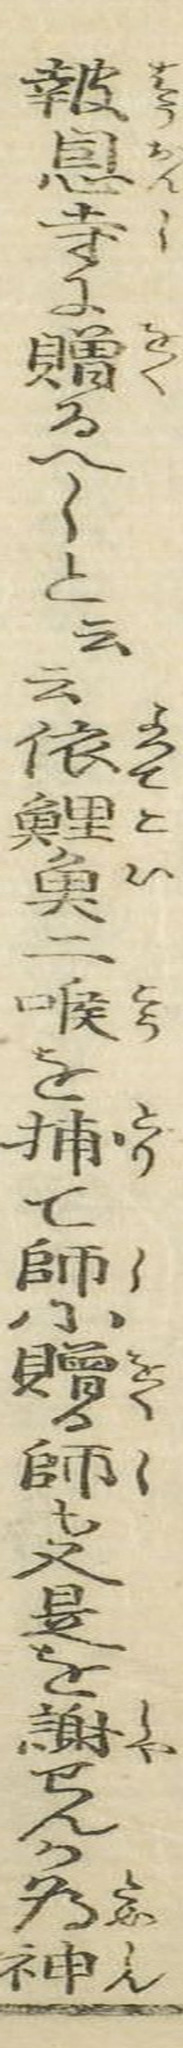報恩寺に贈るへしと云云依鯉魚二喉を捕て師に贈る師も又是を謝せんか為神

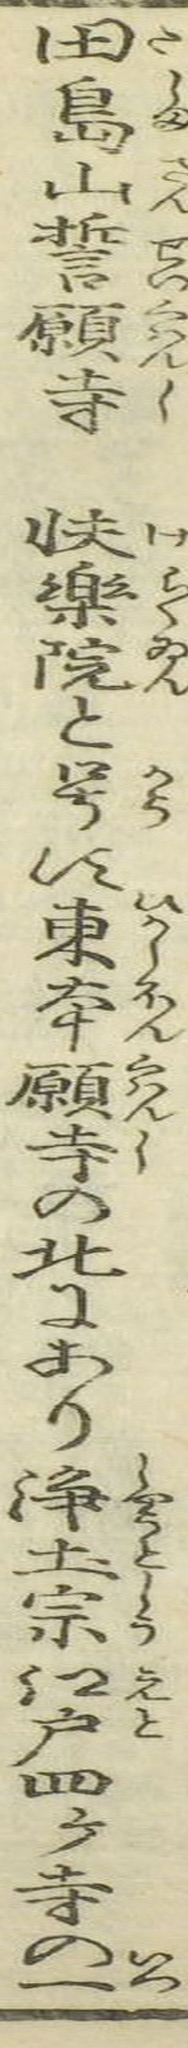田島山誓願寺快楽院と号す東本願寺の北にあり浄土宗江戸四ヶ寺の一
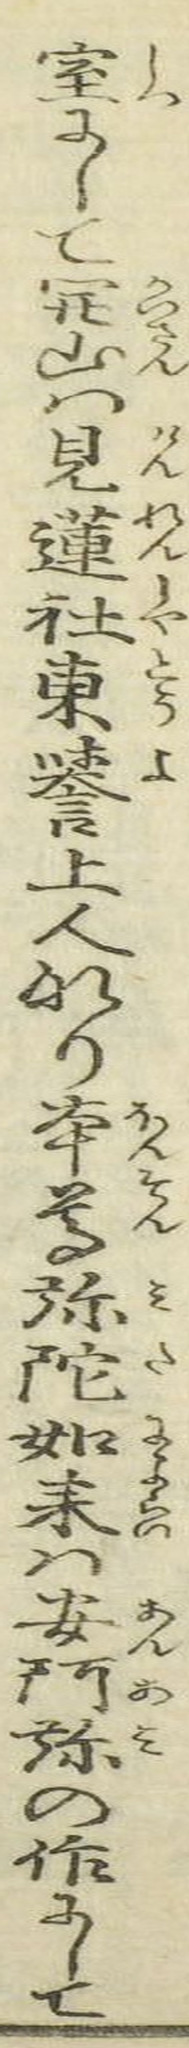室にして開山は見蓮社東誉上人なり本尊弥陀如来は安阿弥の作にして
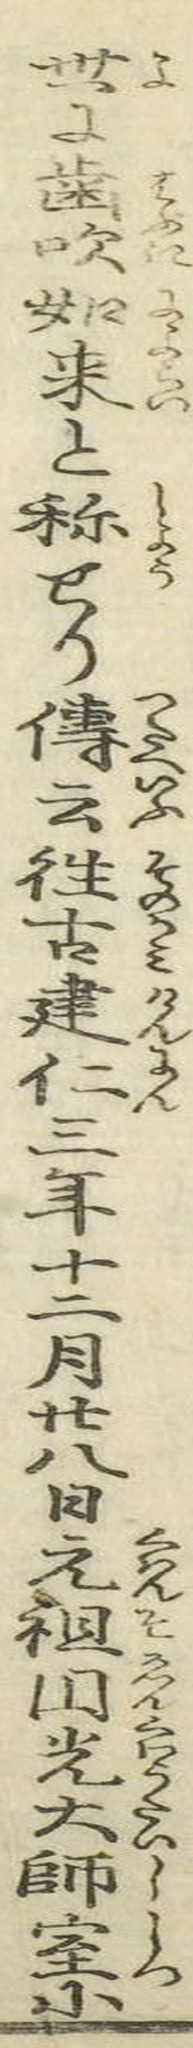世に歯吹如来と称せり伝云往古建仁三年十二月廿八日元祖円光大師室に
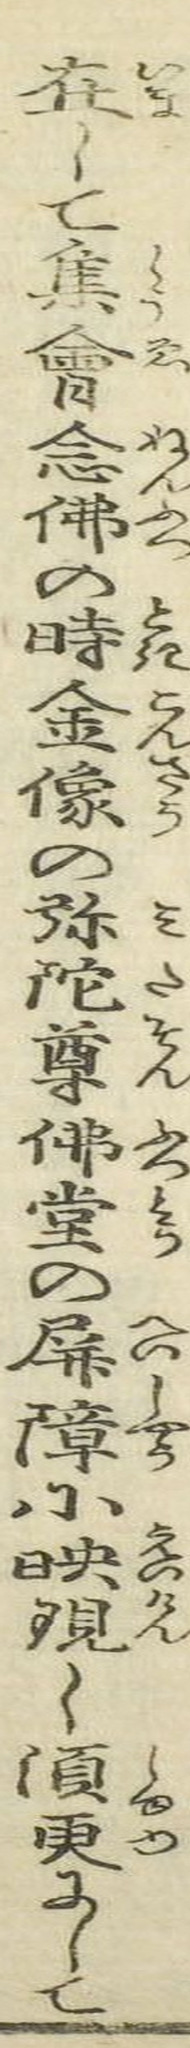在して集会念仏の時金像の弥陀尊仏堂の屏障に映現し須臾にして
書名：江戸名所図会 20巻 巻之16
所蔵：東京学芸大学教育コンテンツアーカイブ
